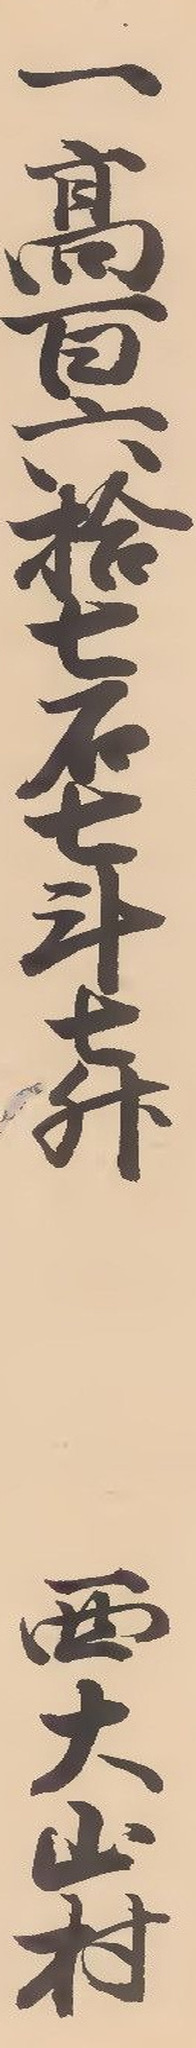一高百六拾七石七斗七升西大山村
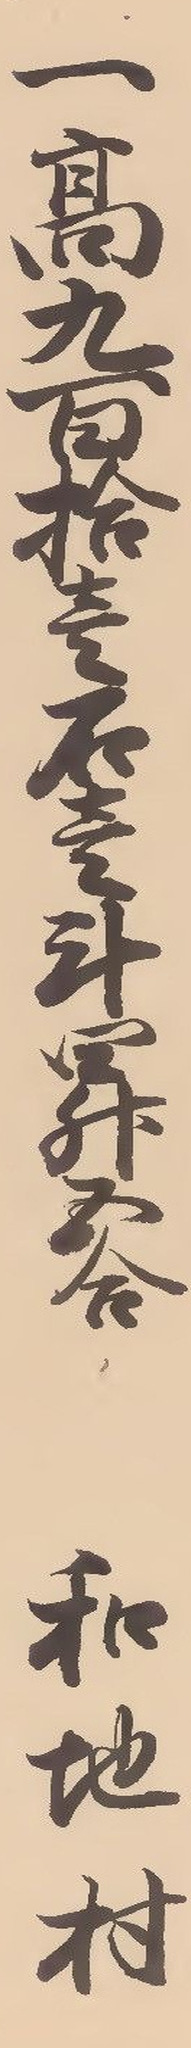一高九百拾壱石壱斗四升五合和地村
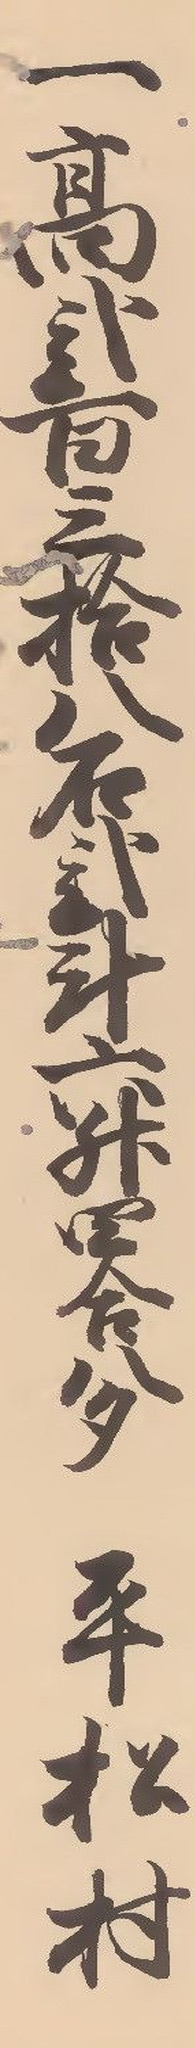一高弐百三拾八石弐斗六升四合八勺平松村

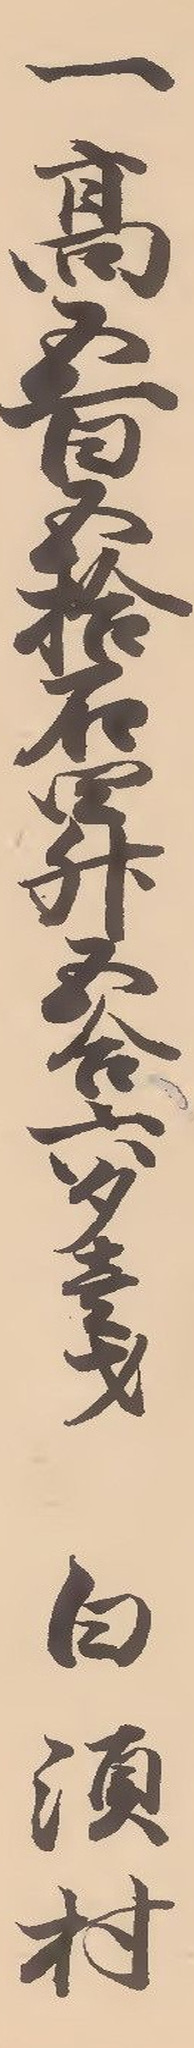一高五百五拾石四升五合六勺壱才白須村
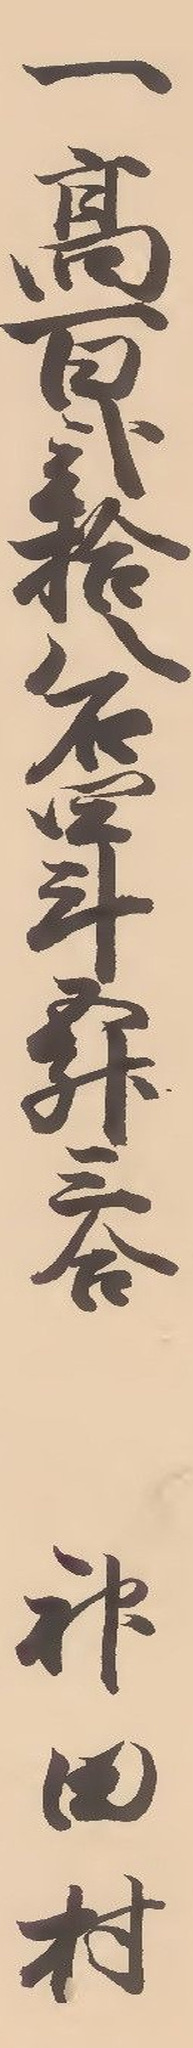一高百弐拾八石四斗五升三合神田村
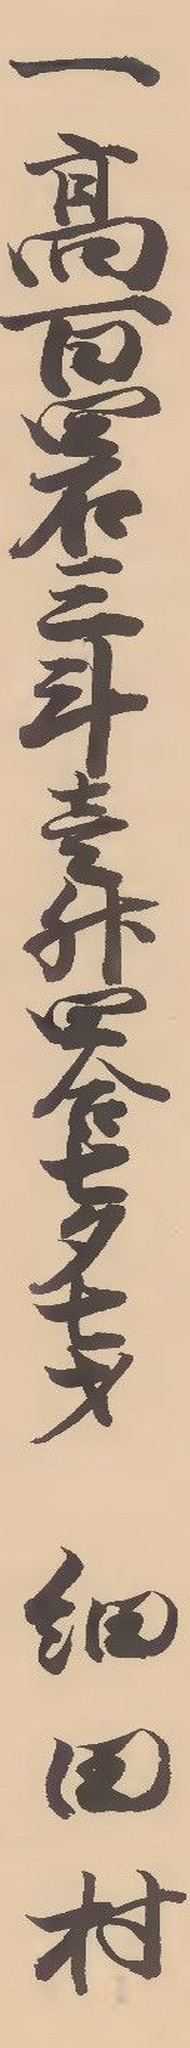一高百四石三斗壱升四合七勺七才細田村
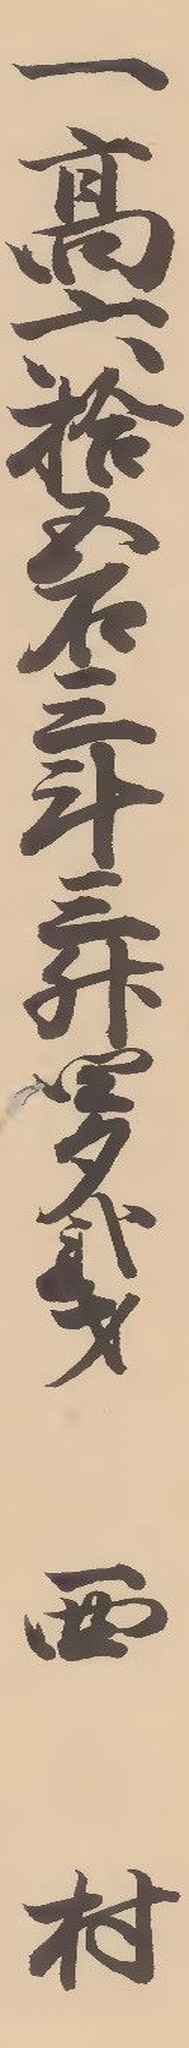一高六拾五石三斗三升四勺弐才西村
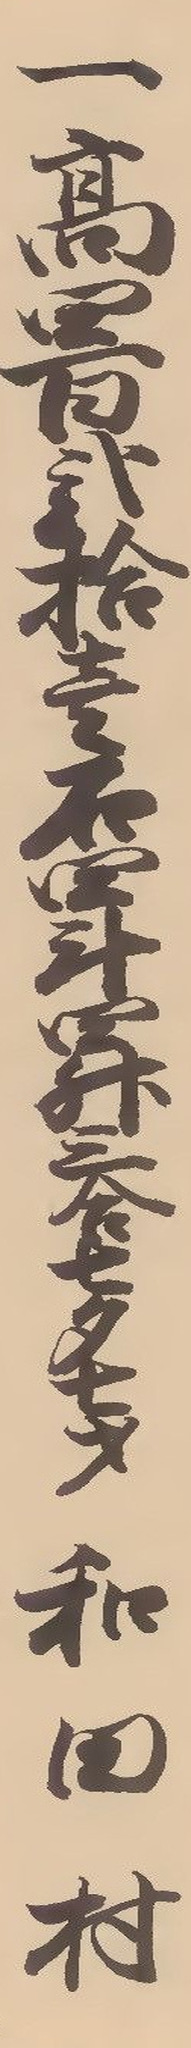一高四百弐拾壱石四斗四升三合七勺七才和田村
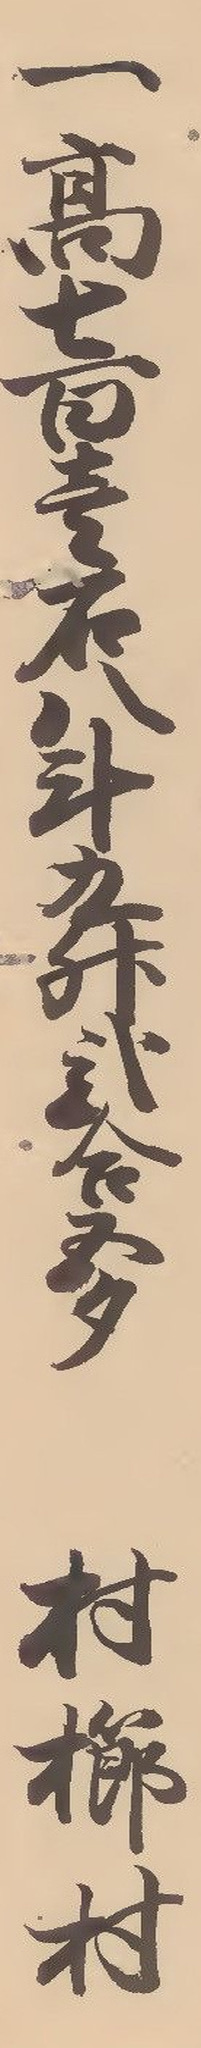一高七百壱石八斗九升弐合五勺村櫛村

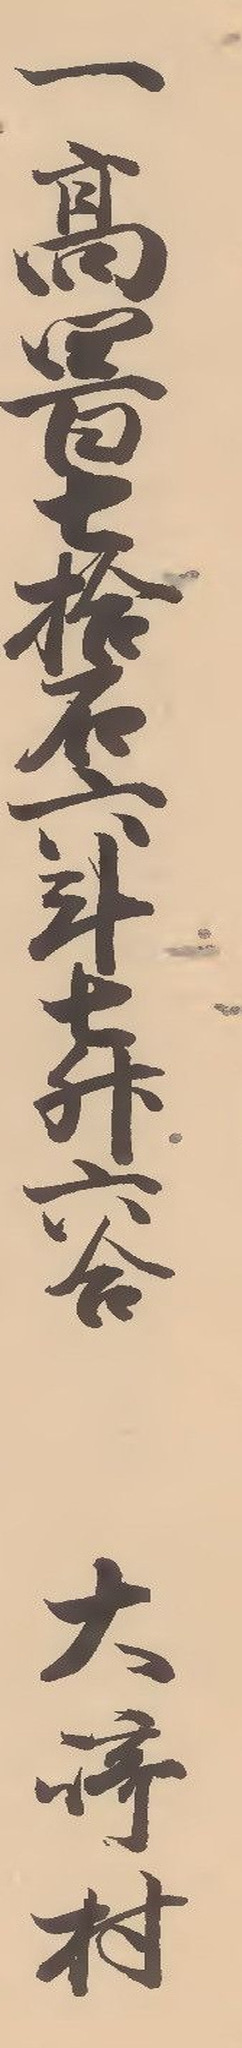一高四百七拾石六斗七升六合大崎村
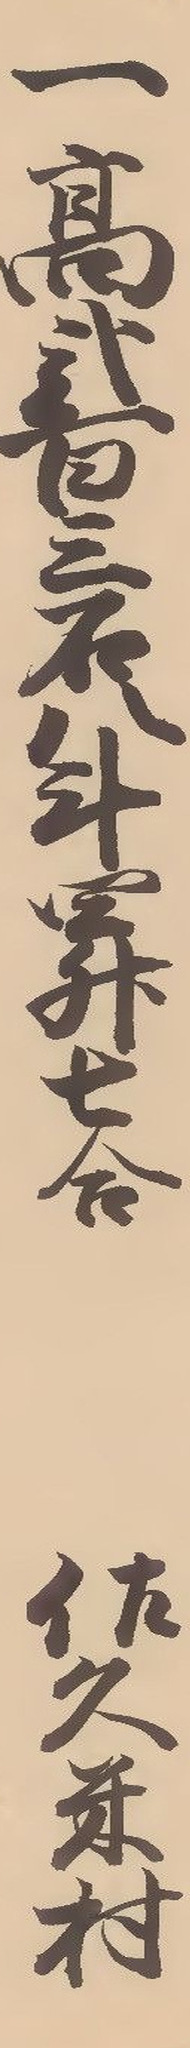一高弐百三石八斗四升七合佐久米村
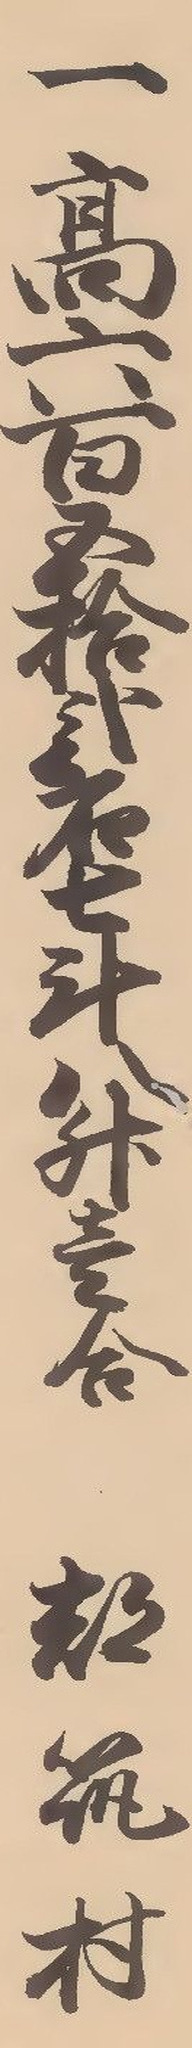一高六百五拾弐石七斗八升壱合都筑村
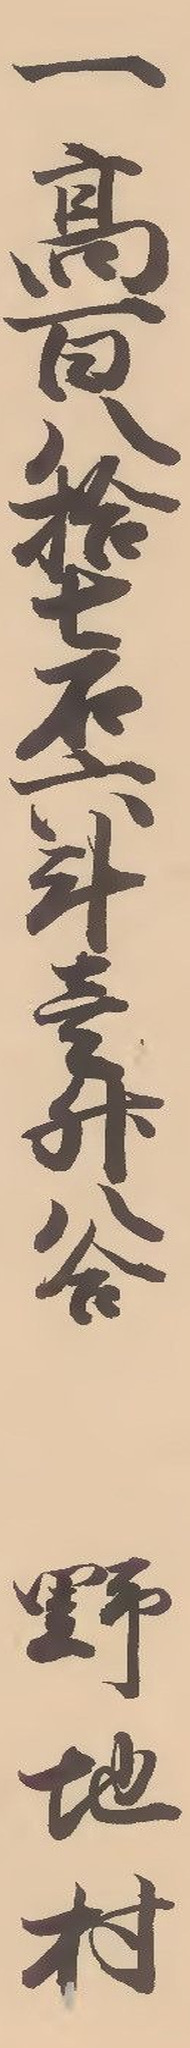一高百八拾七石六斗壱升八合野地村
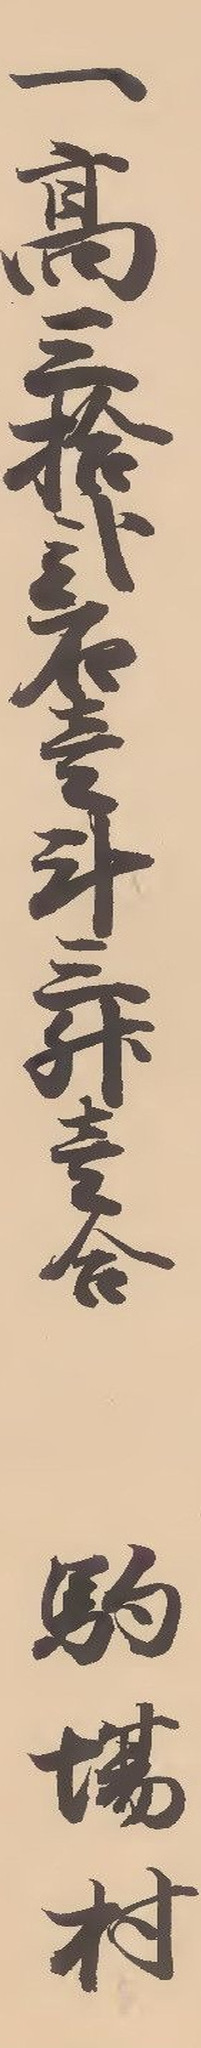一高三拾弐石壱斗三升壱合駒場村
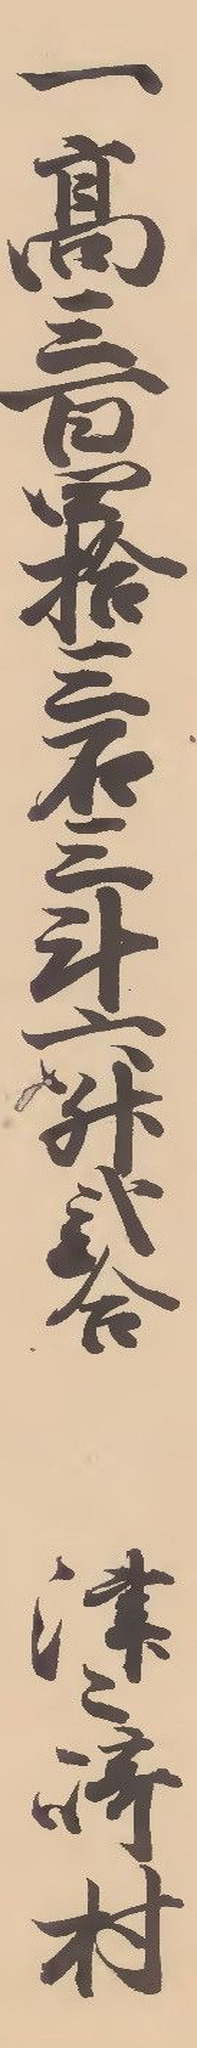一高三百四拾三石三斗六升弐合津々崎村
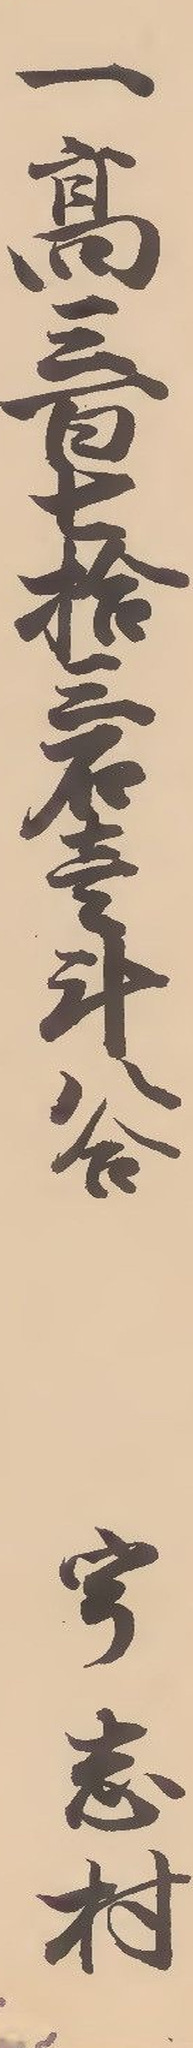一高三百七拾三石壱斗八合宇志村
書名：遠江国郷帳
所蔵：国立公文書館 National Archives of Japan
